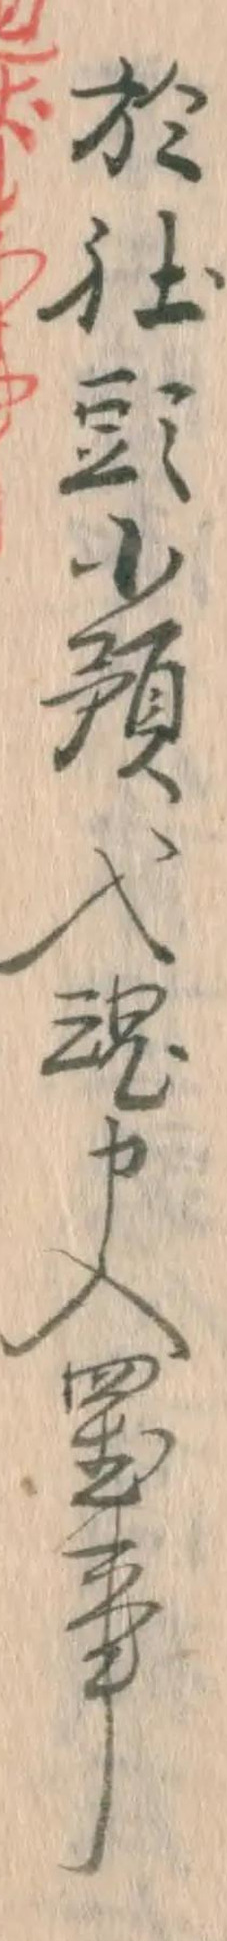於社頭小預へ入魂申入置事
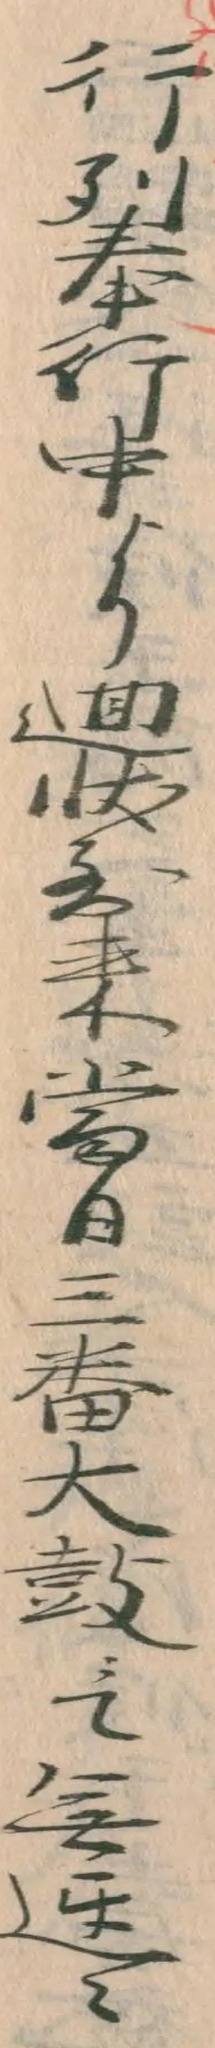一行列奉行中より廻状到来當日三番大鼓ニて無遅に
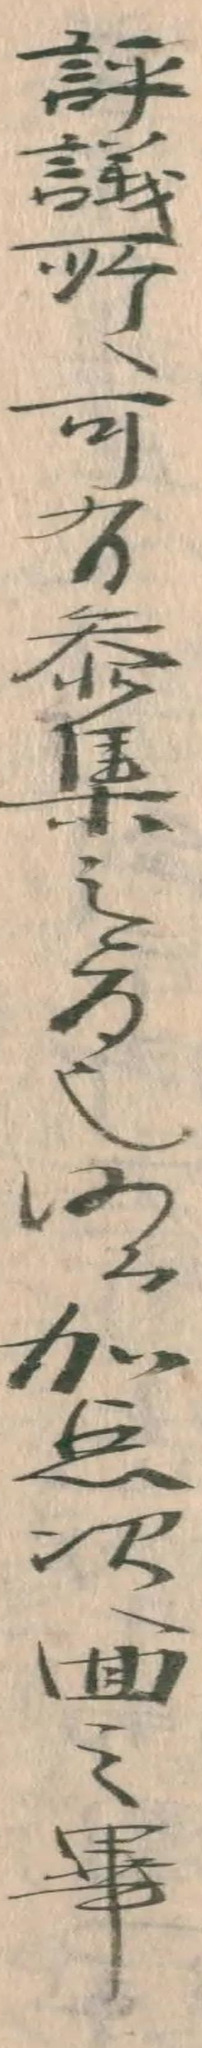評議所へ可有参集之旨也仍而加点次へ回之畢
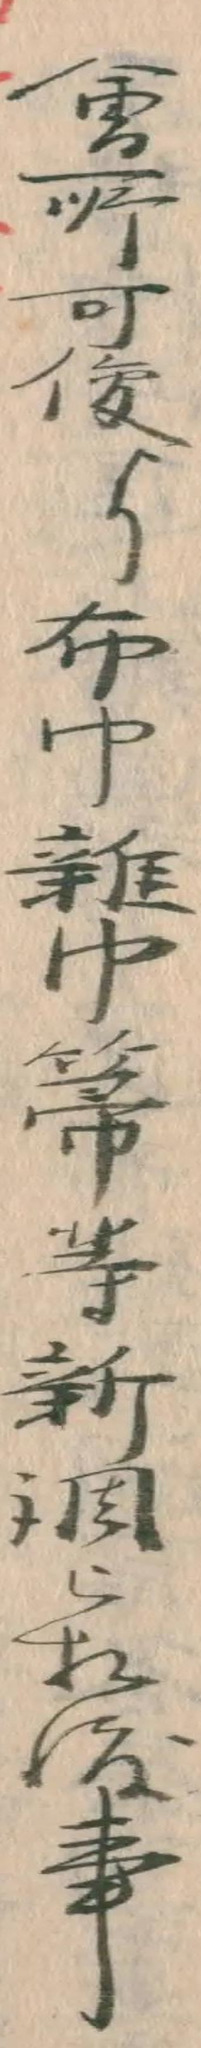一會所可俊より布巾雑巾箒等新調被相渡事
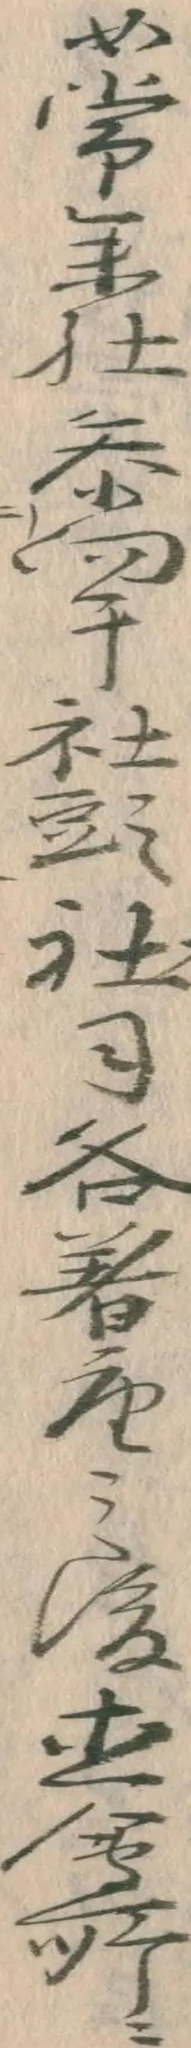如常参社参向于社頭社司各着座之後直會所ニ
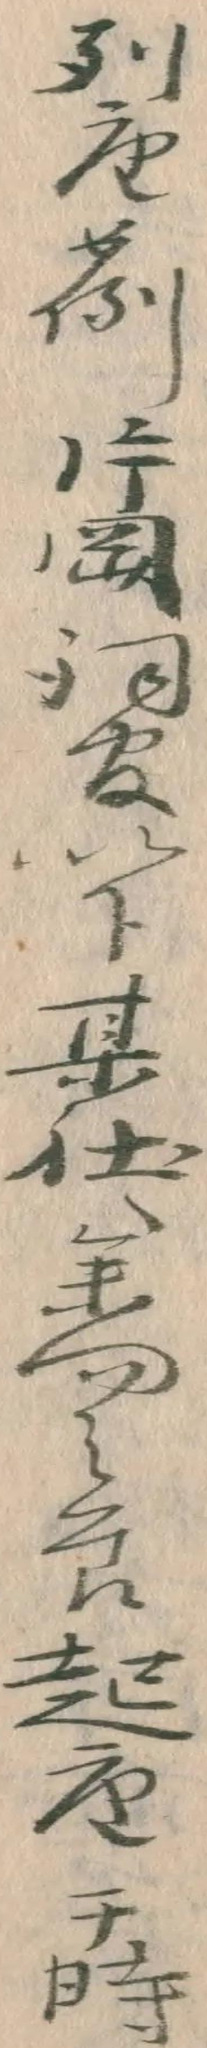列座如例片岡祠官以下某社へ参向之節起座于時
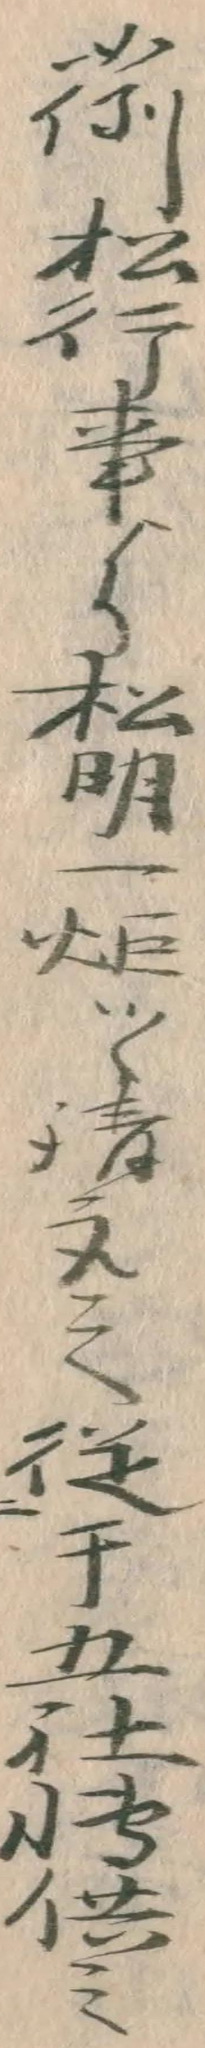如例松行事より松明一炬ツヽ請取之従于五社轉供之
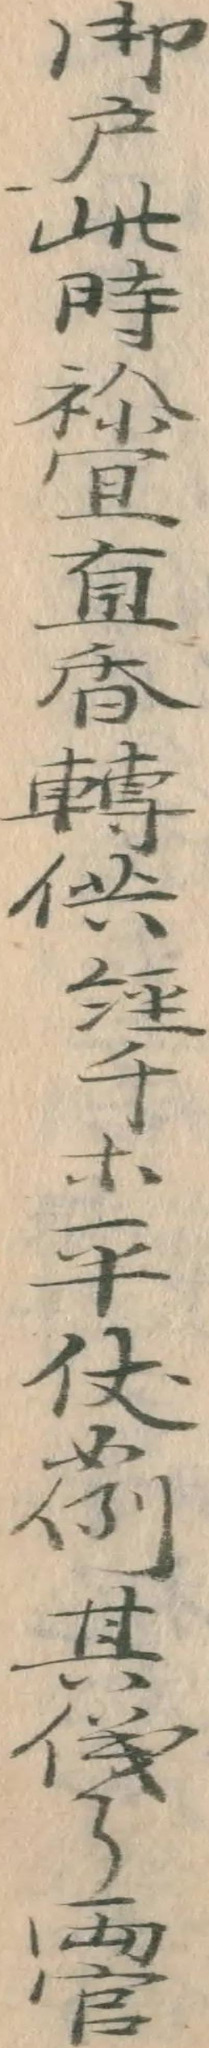御戸此時祢宜直沓轉供経千等平伏如例其儀了両官

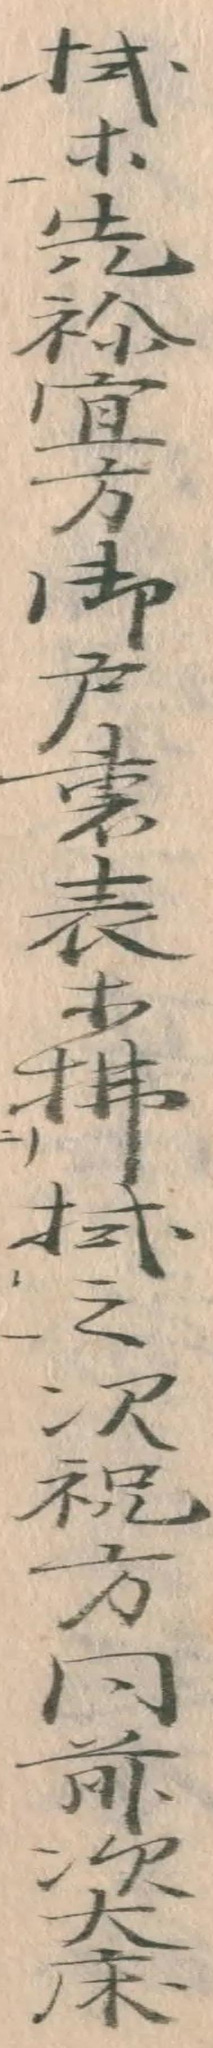拭等先祢宜方御戸裏表等払拭之次祝方同前次大床
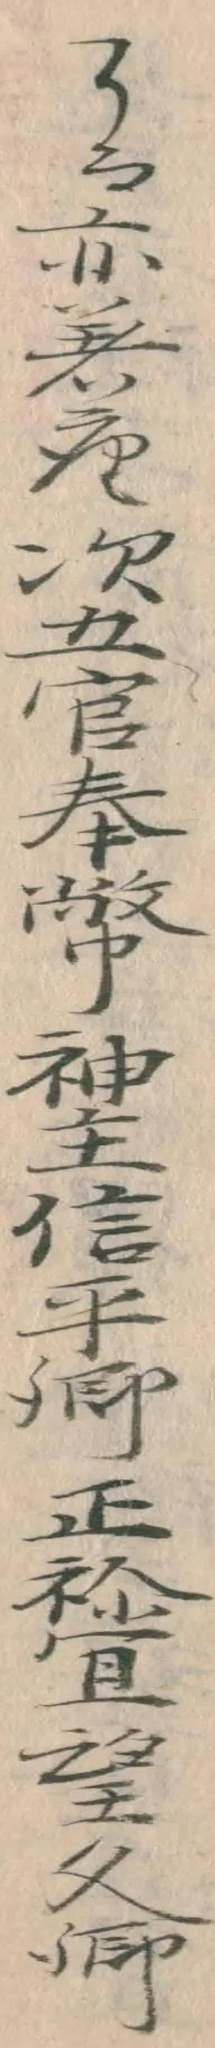了而亦着座次五官奉幣神主信平卿正祢宜望久卿
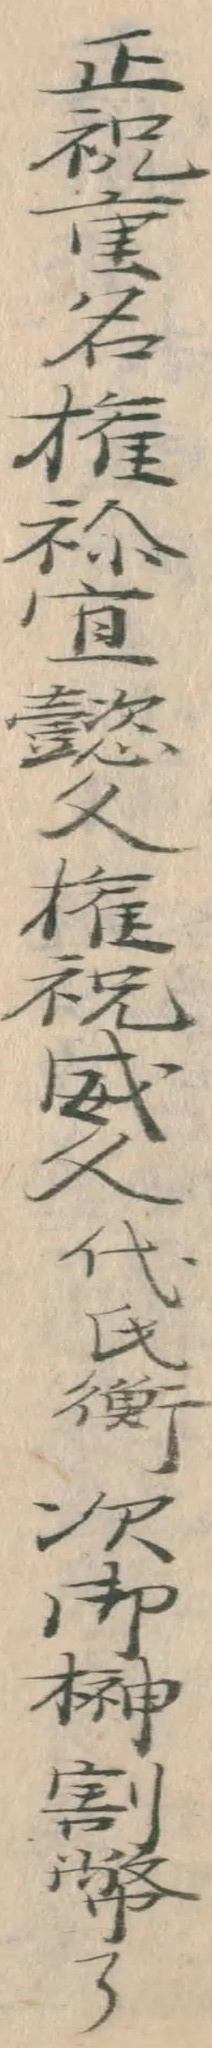正祝重名権祢宜懿久権祝威久代氏衡次御榊割幣了
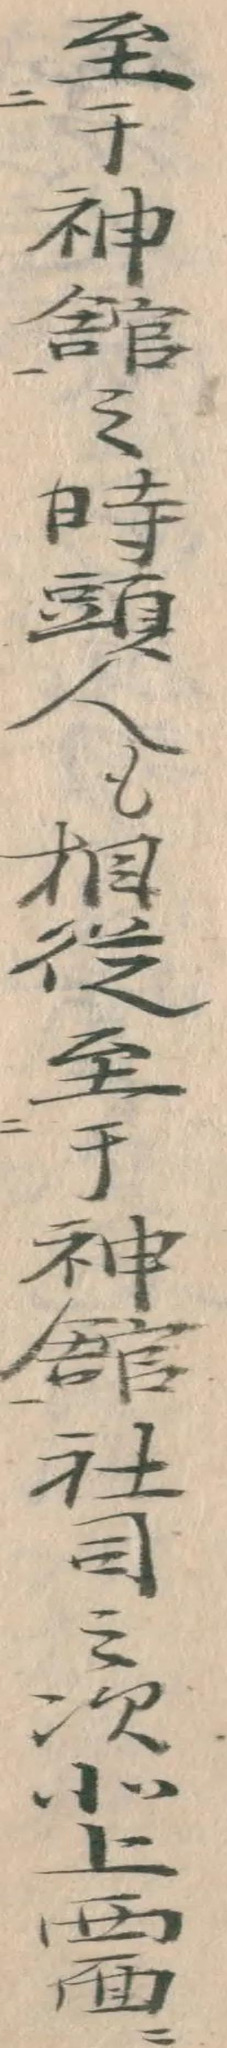至于神舘之時頭人も相従至于御舘社司之次北上西面ニ
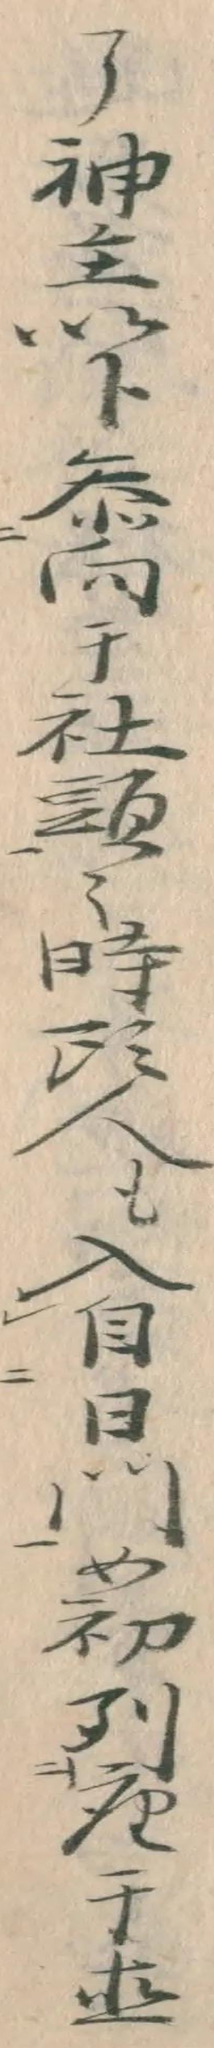了神主以下参向于社頭之時頭人も入自日門如初列座于直
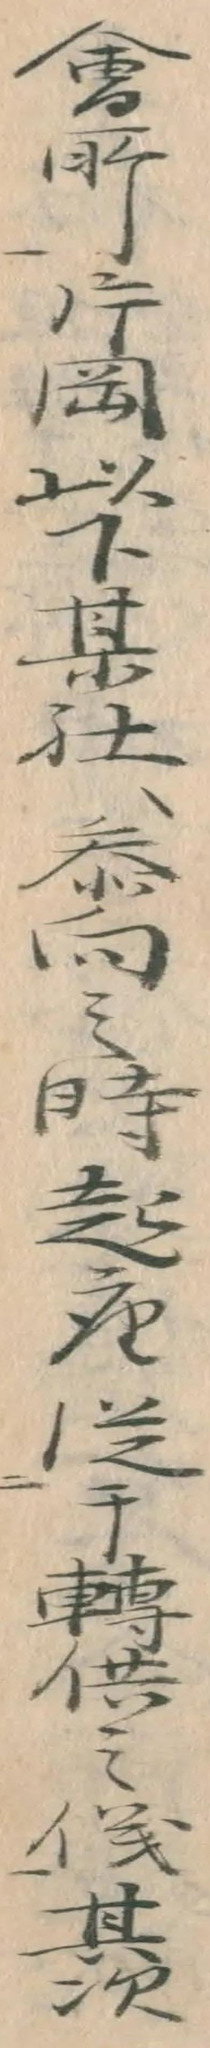會所片岡以下某社へ参向之時起座従于轉供之儀其次

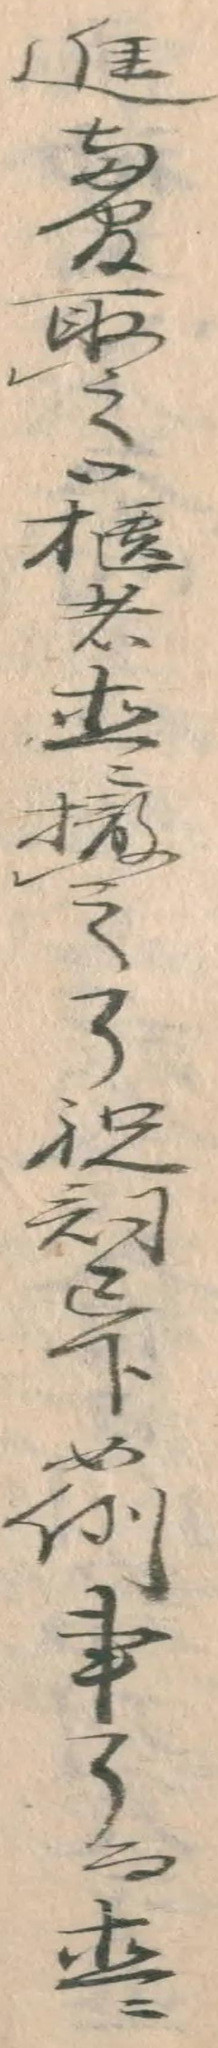進両官取之御櫃は直ニ撤之了祝詞已下如例事了而直ニ
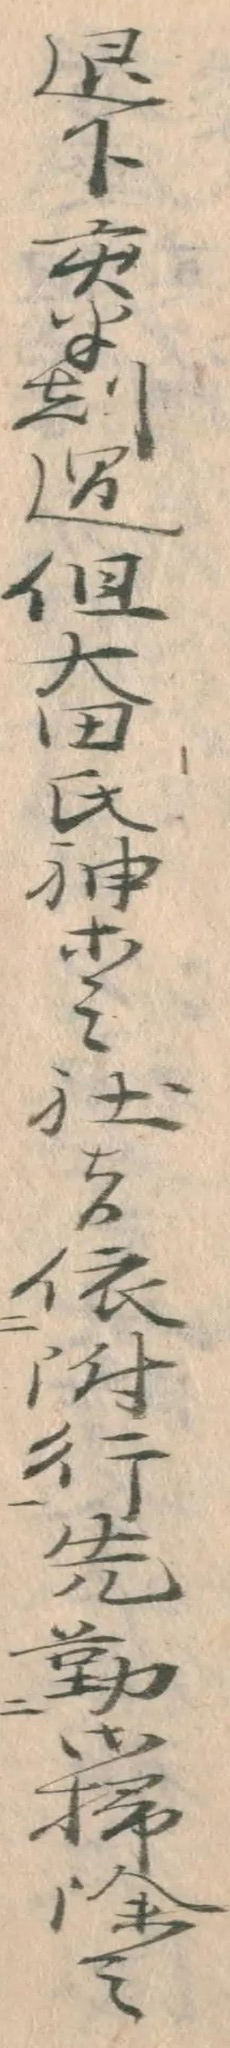退下亥半刻過但大田氏神等之社は依附行先勤御掃除之
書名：賀茂社記録. 第73冊
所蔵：国立国会図書館 National Diet Library, JAPAN
